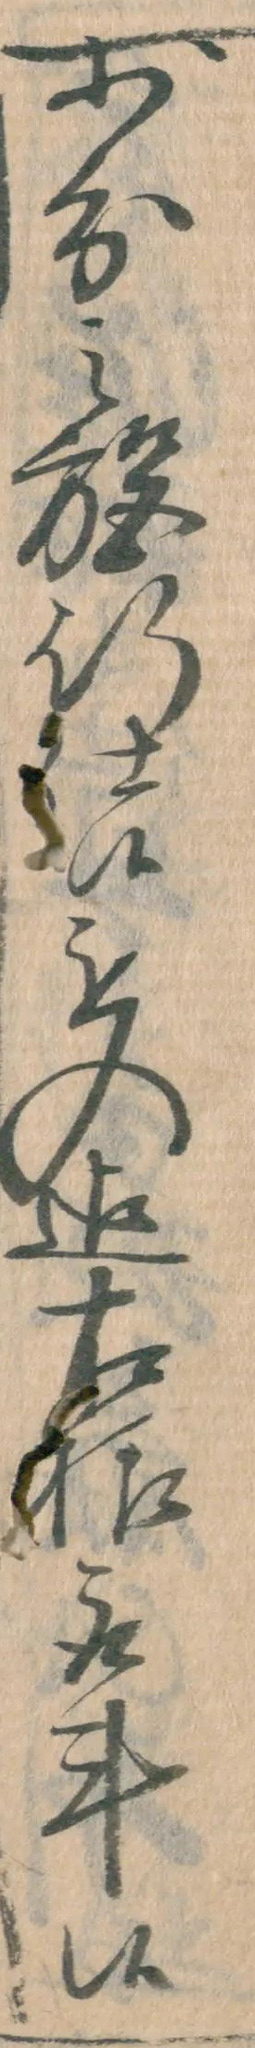少分之施行仕候もの迄左様取計候」

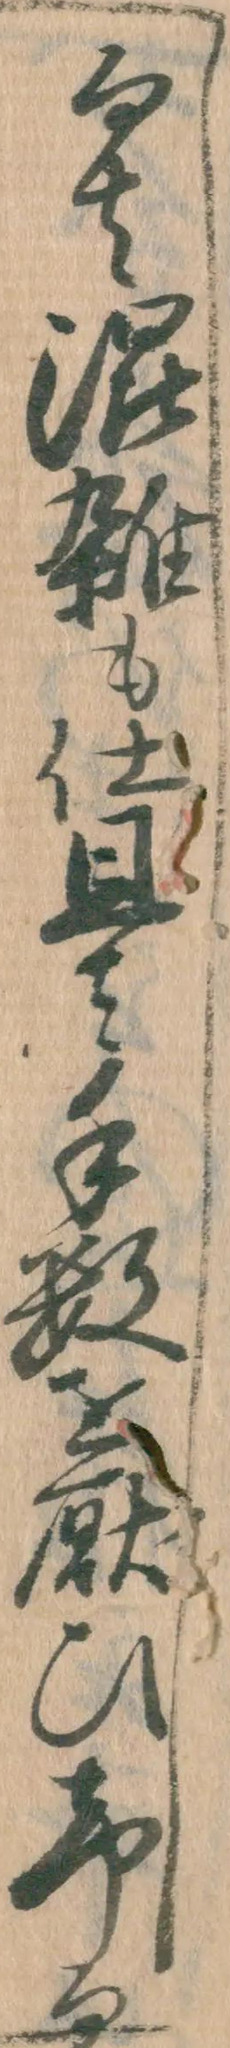「而は混雑も仕且は手数を厭ひ却而
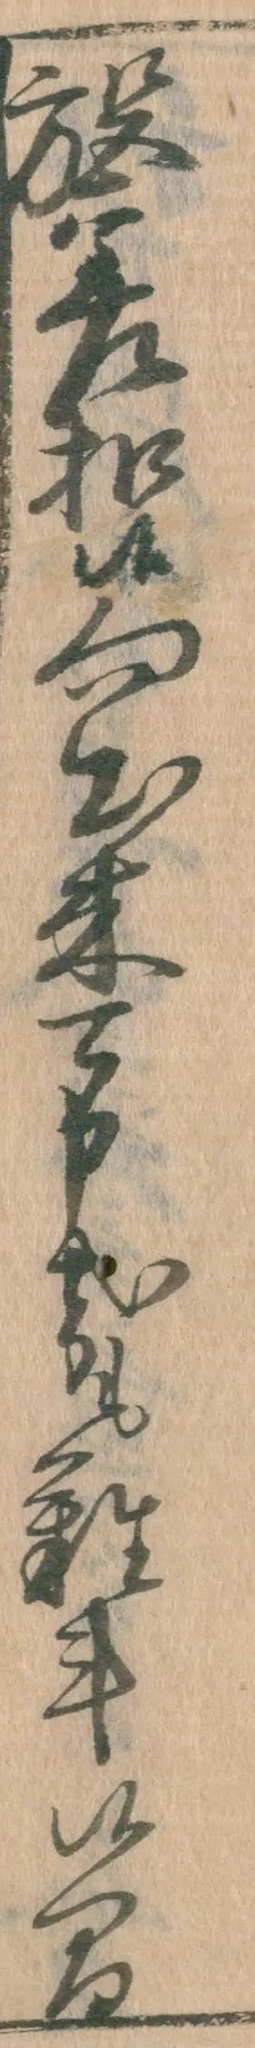施差扣候向出来可申哉も難計候間」
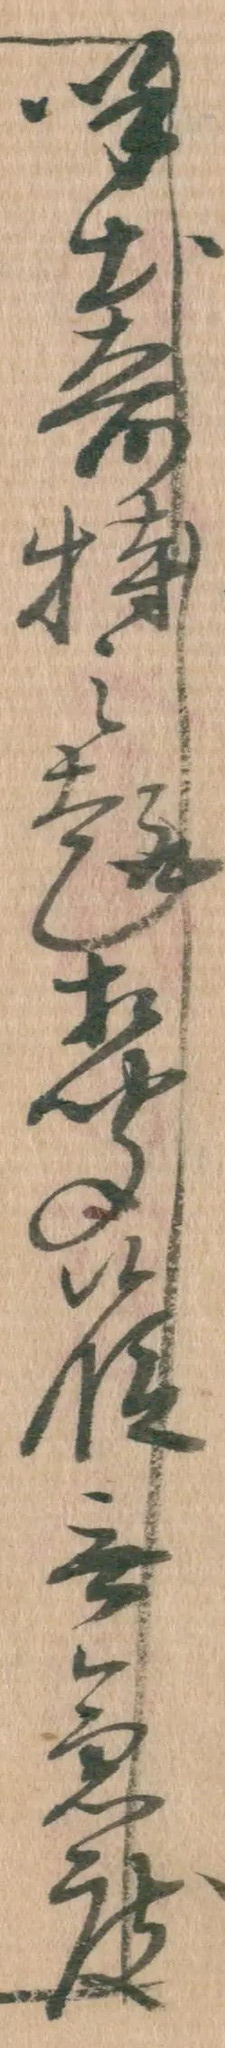「呼出奇特之趣相聞候段無急度
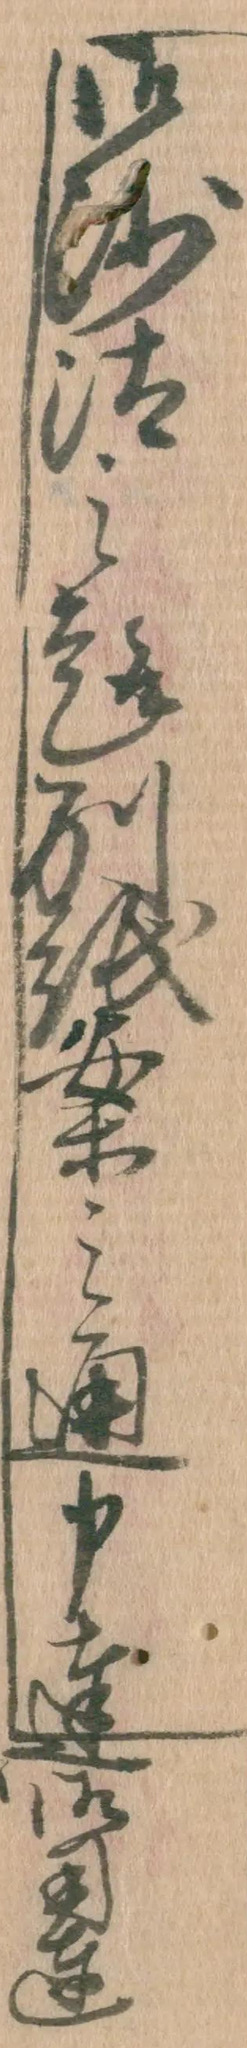御沙汰之趣別紙案之通申達」△御用達
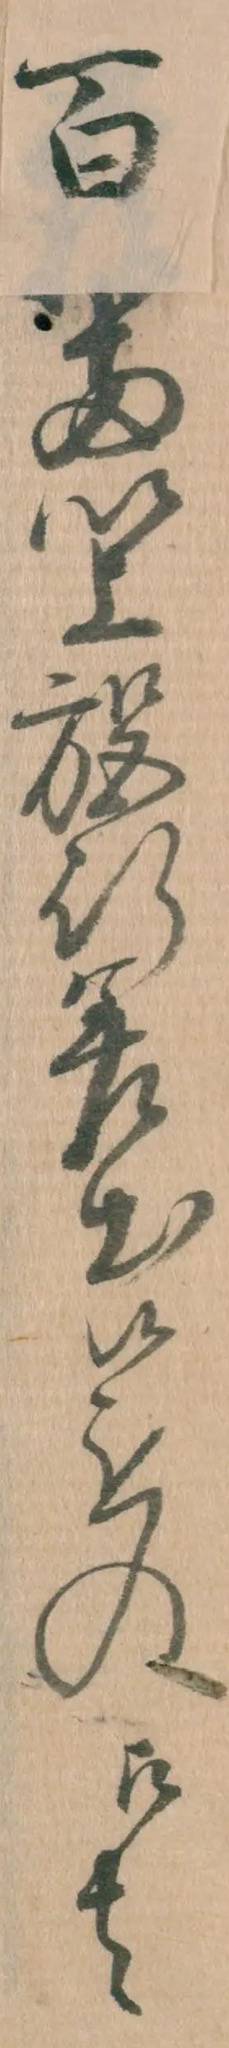百両以上施行差出候ものえは
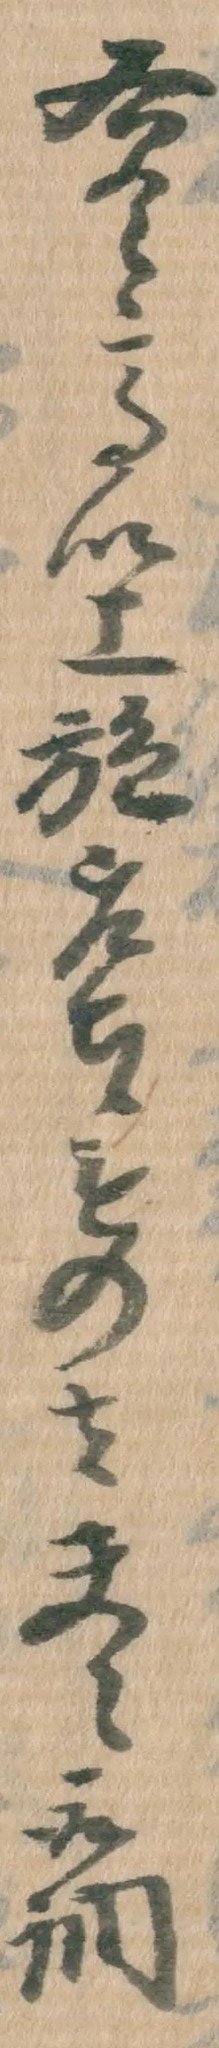右金高以上施差出候ものは夫々取調
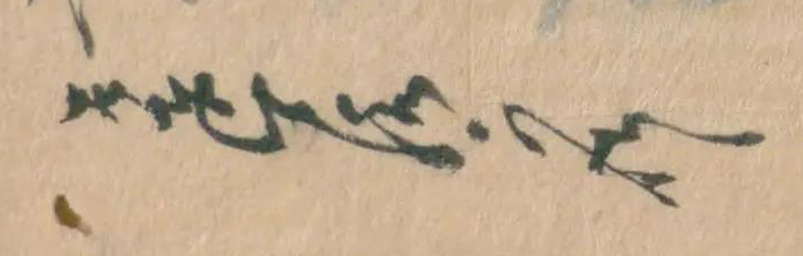相達称可仕候

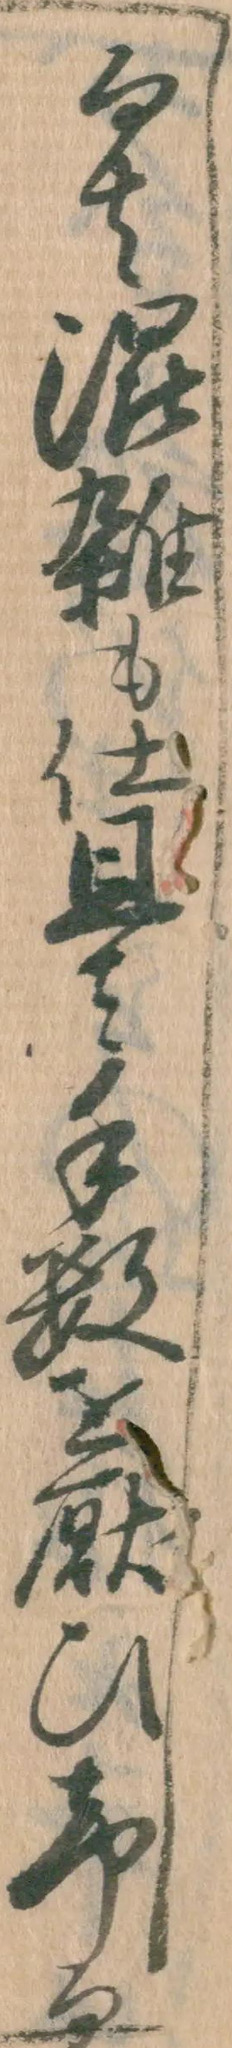「而は混雑も仕且は手数を厭ひ却而
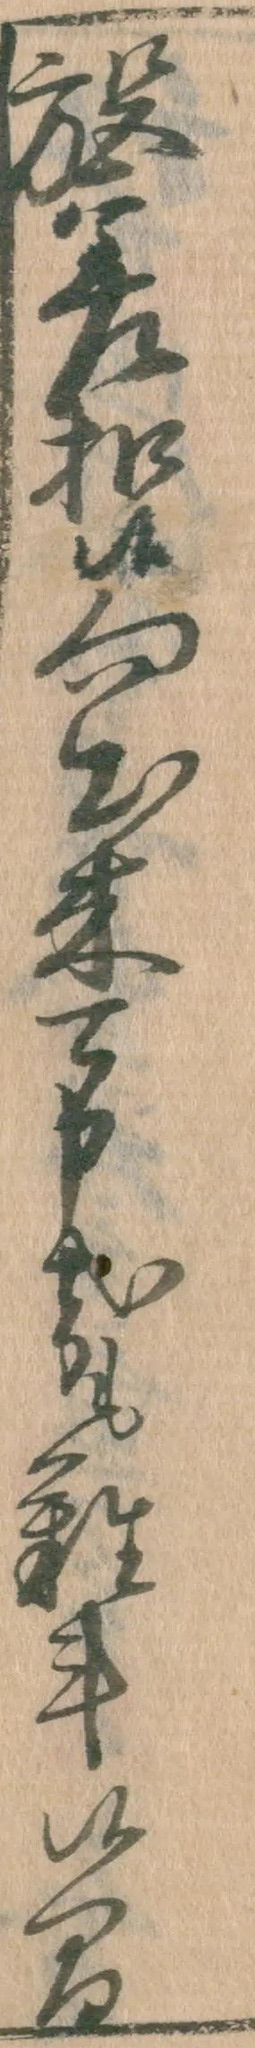施差扣候向出来可申哉も難計候間」
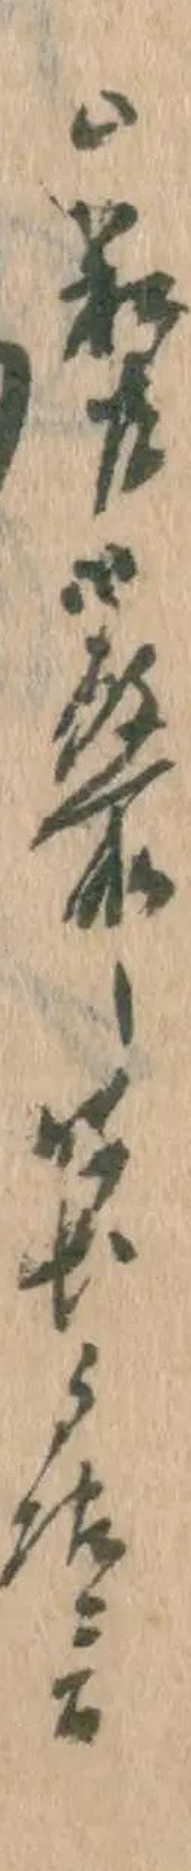◯私共御役所へ呼出手銀ニ而
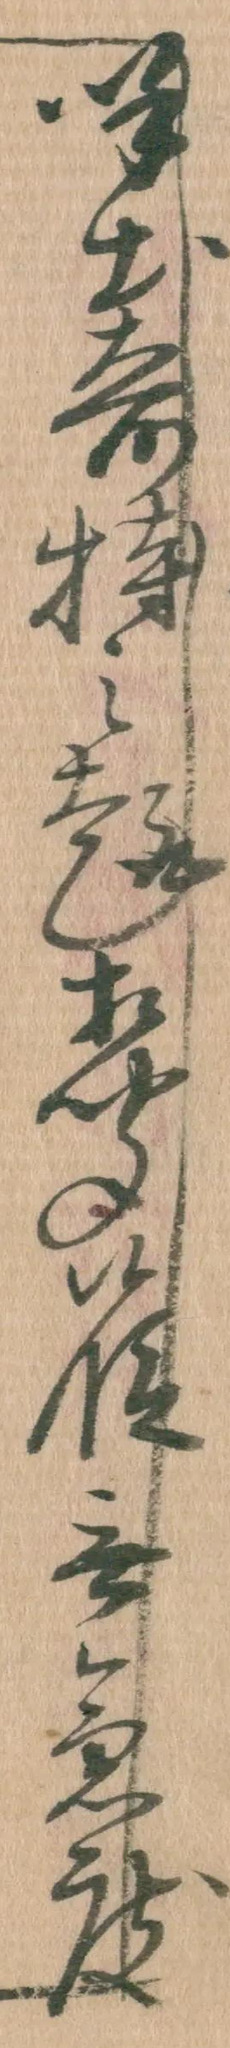「呼出奇特之趣相聞候段無急度
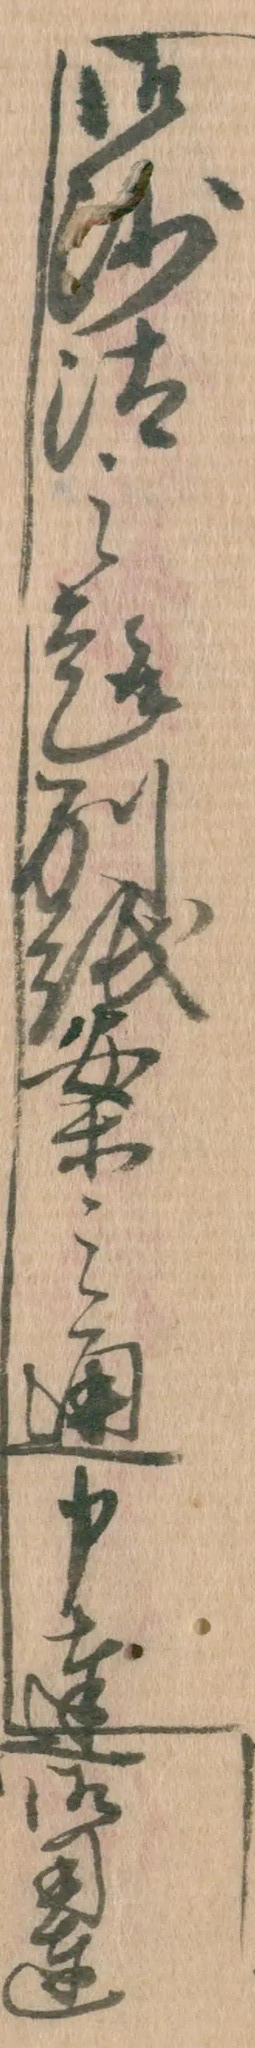御沙汰之趣別紙案之通申達」△御用達
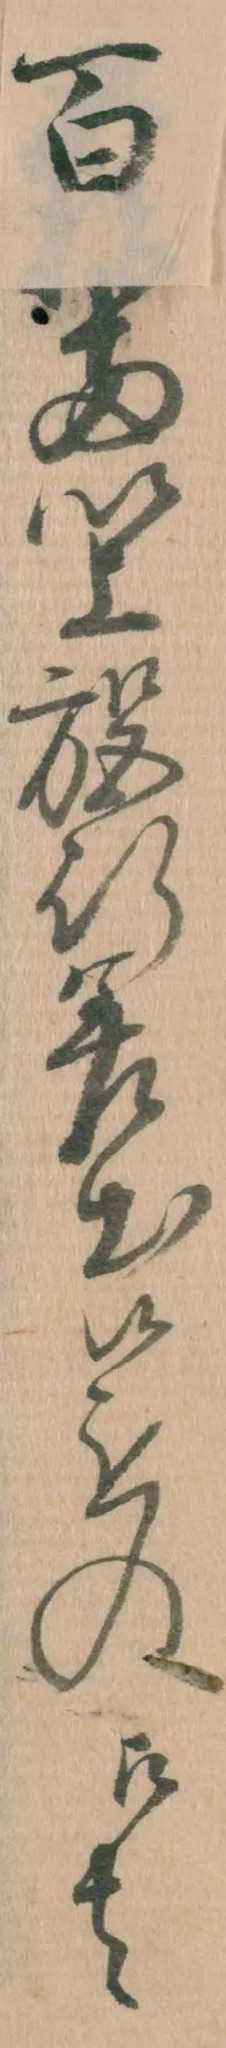百両以上施行差出候ものえは
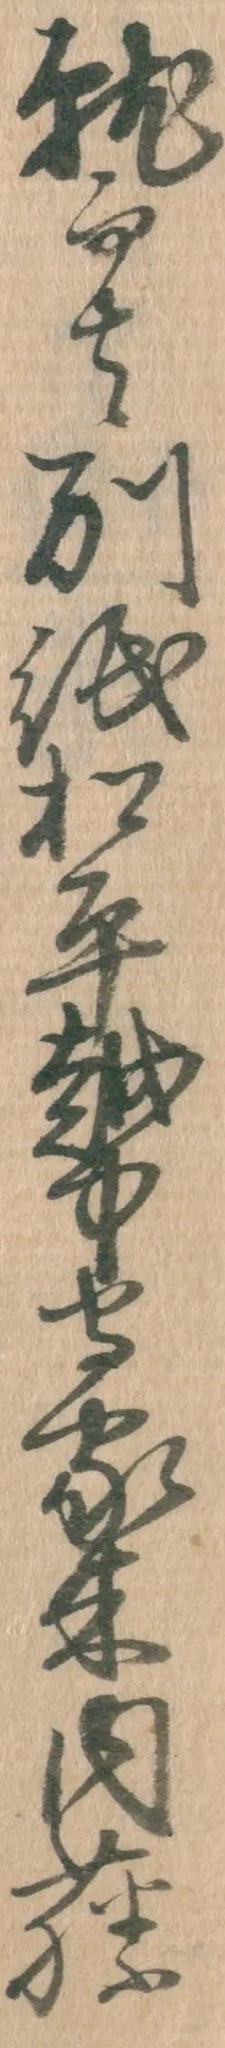就而は別紙松平越中守家来内藤
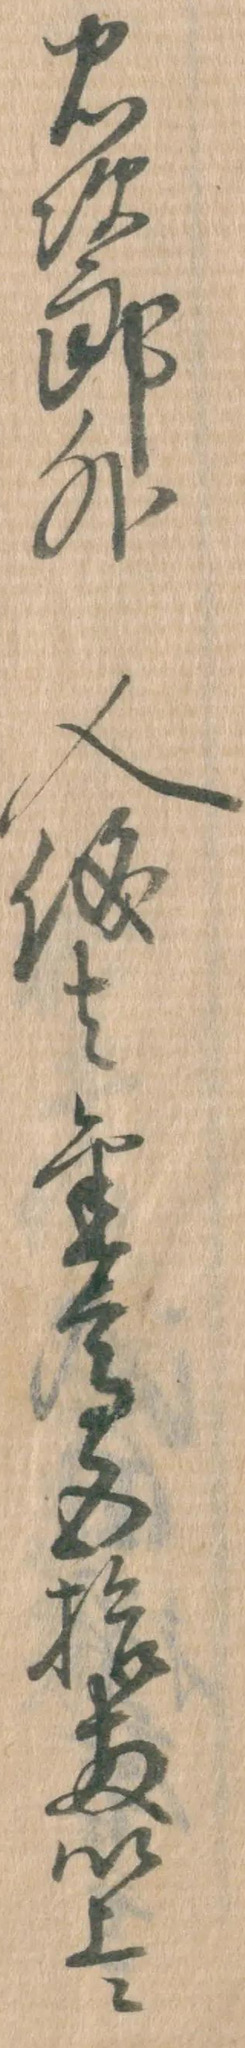忠次郎外人儀は金高五拾両以上ニ
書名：武家方并寺院等ニテ施差出候一件
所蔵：国立国会図書館 National Diet Library, JAPAN
